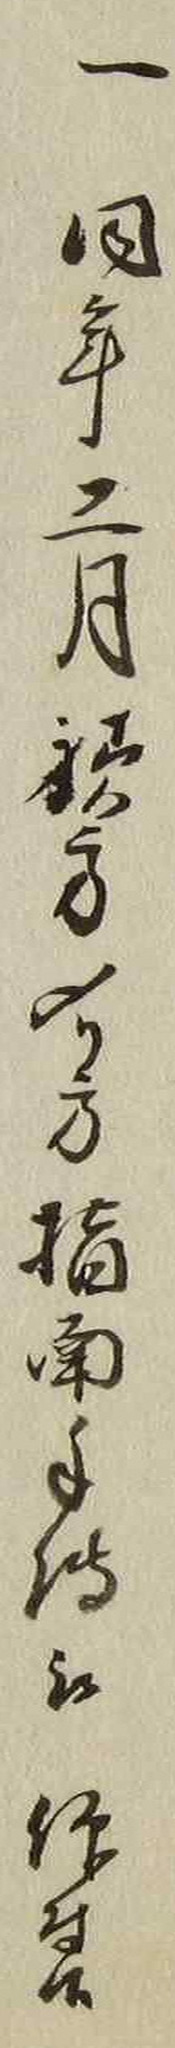一同年十一月躾方〆り方指南手伝被仰付候
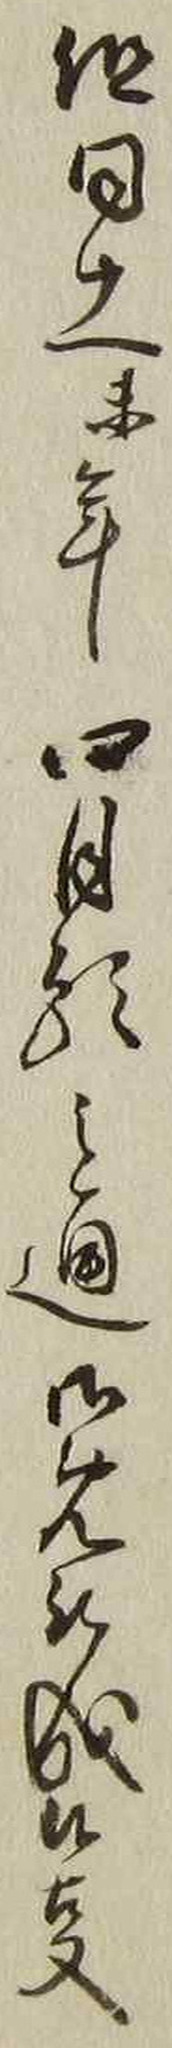但同十一未年四月願之通御免被成候事
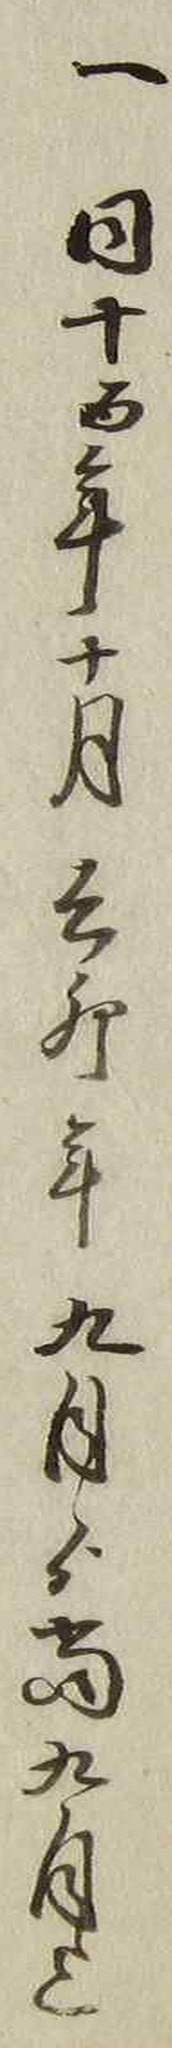一同十酉年十月去卯年九月ゟ当九月迄
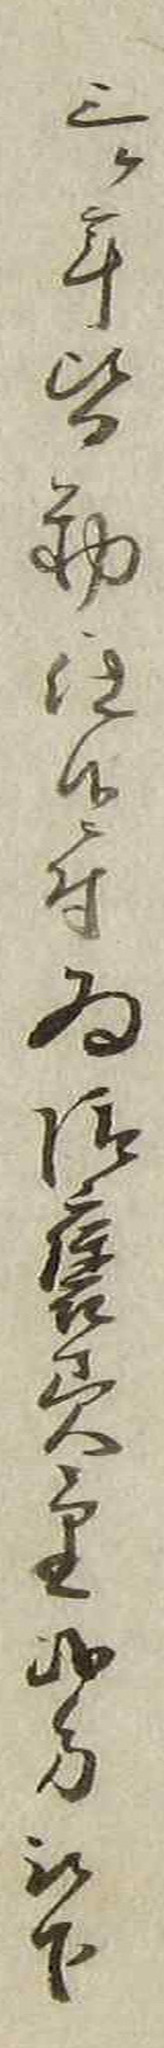三ケ年皆勤仕候ニ付為御褒美金弐分被下
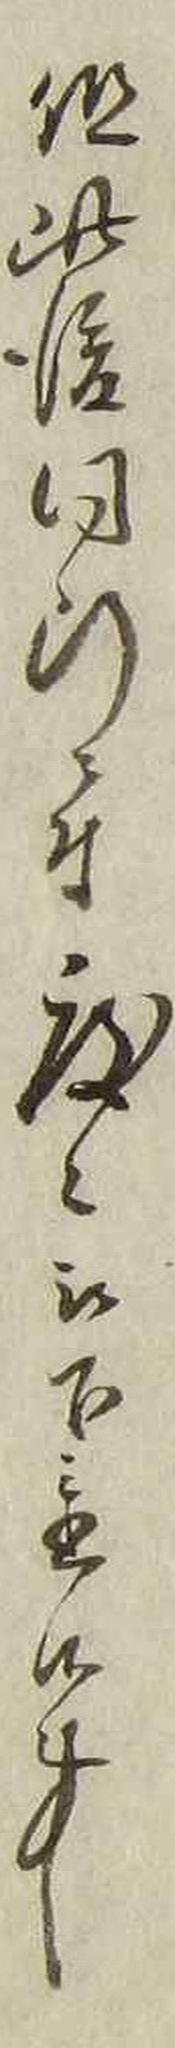但此後同断ニ付度々被下置候事
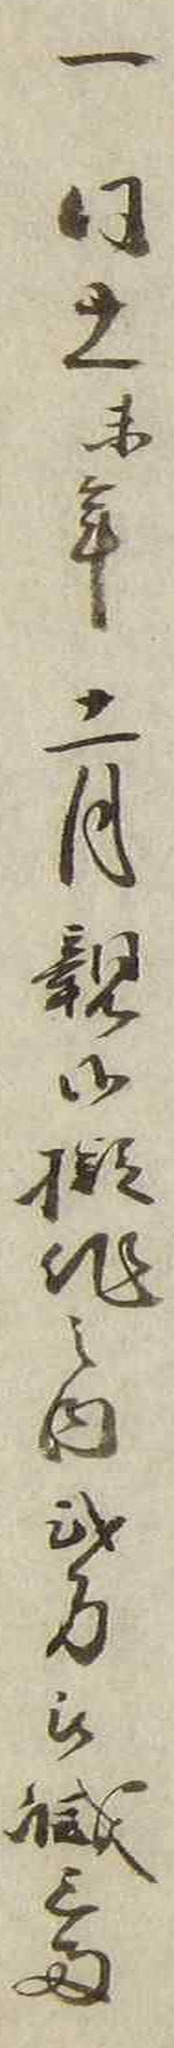一同十一未年十一月親御擬作之内弐分被減三両

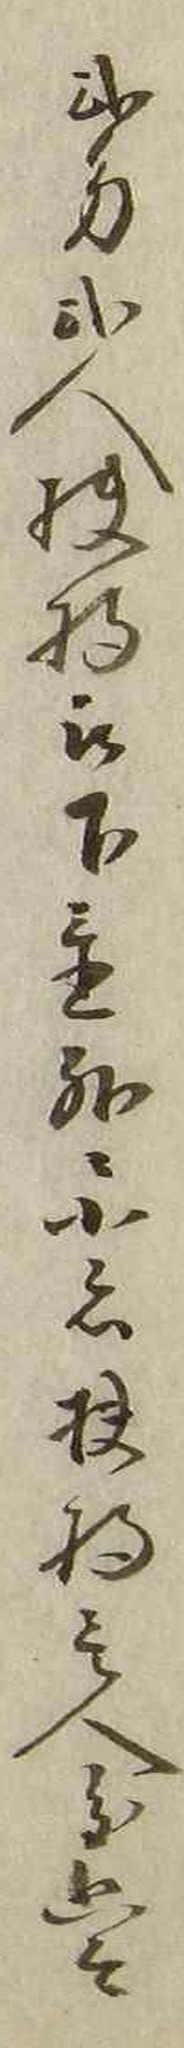弐分弐人扶持被下置外ニ小者扶持壱人分只今
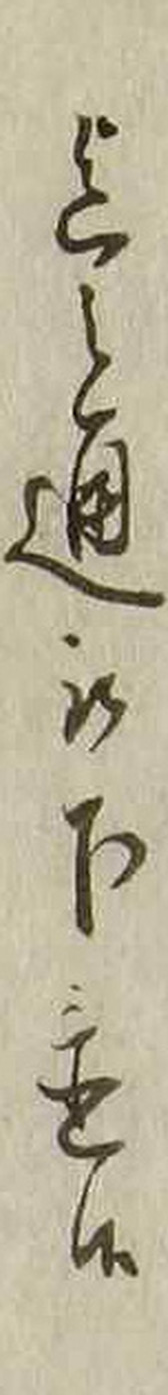迄之通被下置候
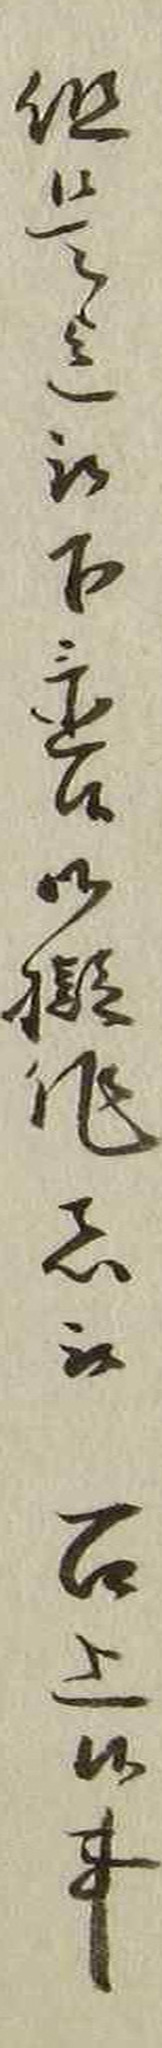但是迄被下置候御擬作者被召上侯事
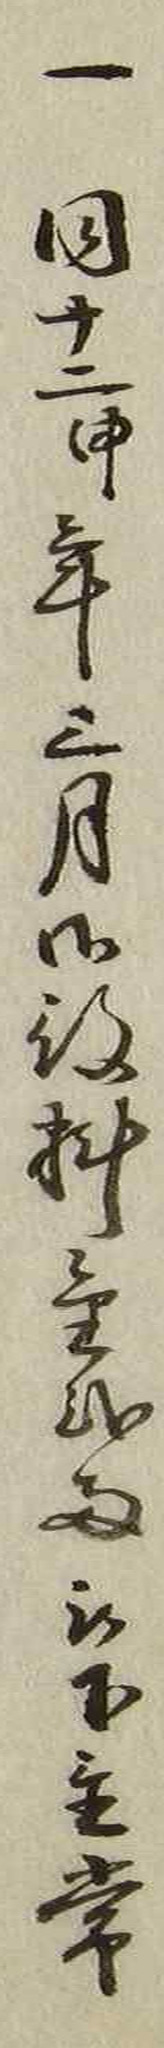一同十二申年三月御役科金弐両被下置常
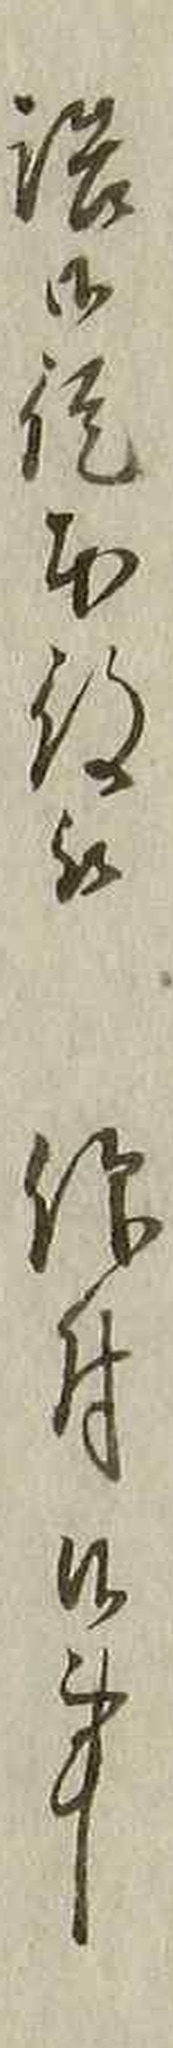詰御徒本役被仰付候事
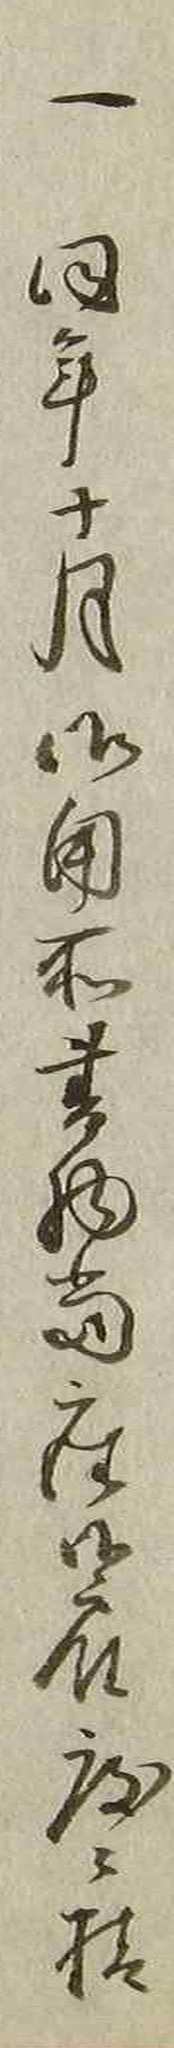一同年十月御用所書物当座御雇度々精
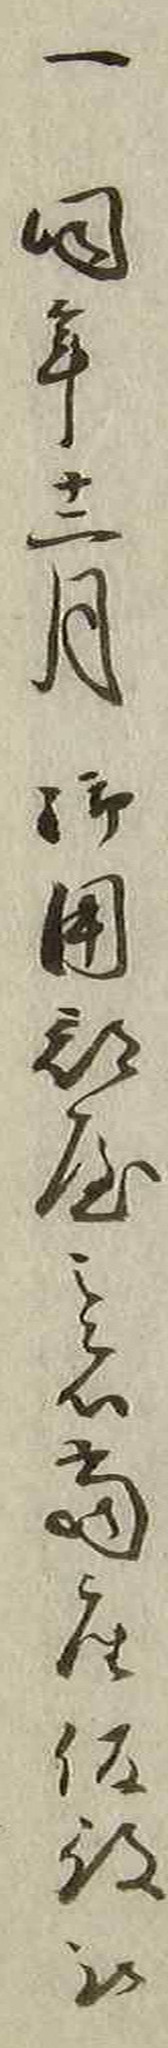一同年十二月御用部屋之者当座仮役被
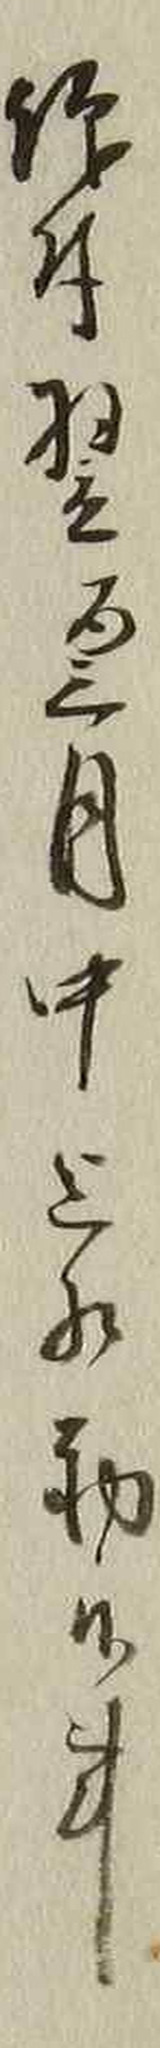仰付翌酉三月中迄相勤候事
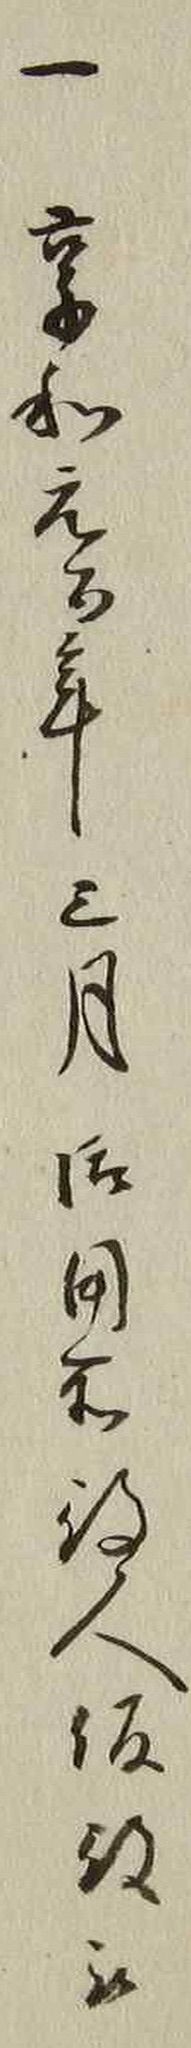一享和元酉年三月御用所役人仮役被
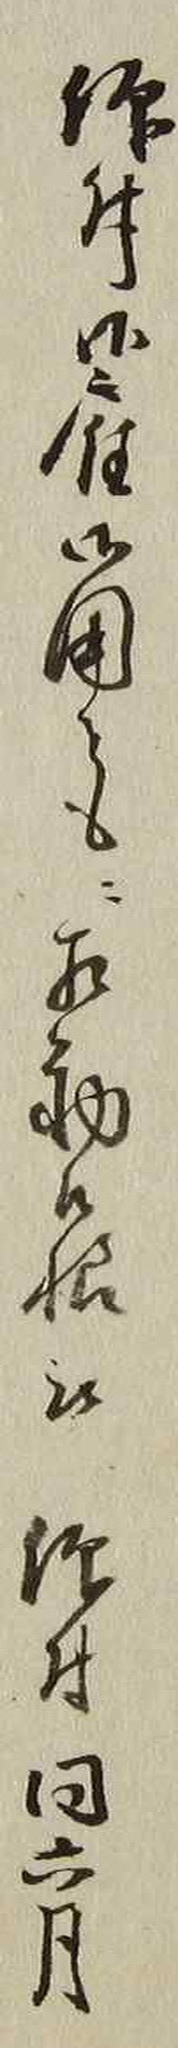仰付御雇御用ともニ相勤候様被仰付同六月
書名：諸士系譜　巻之132　た之部8
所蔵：会津若松市立会津図書館
